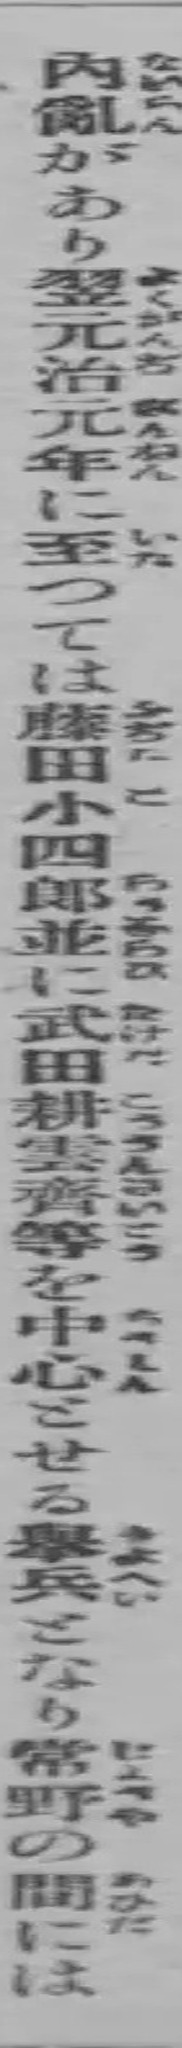竹田耕雲斎内乱があり翌元治元年に至つては藤田小四郎並に竹田耕雲斎等を中心とせる挙兵となり常野の間には
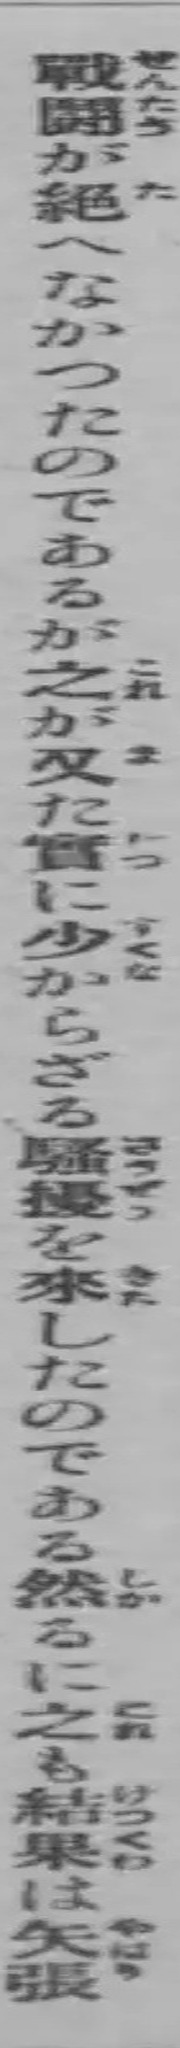戦闘が絶へなかつたのであるが之が又た実に少からざる騒擾を来したのである然るに之も結果は矢張
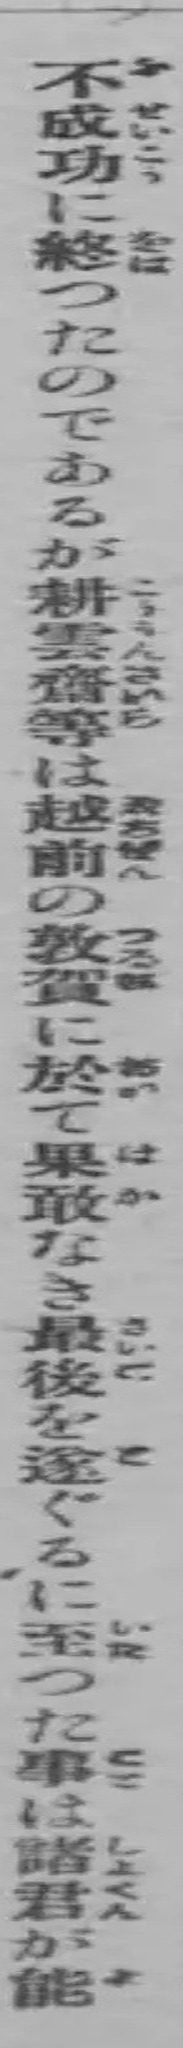不成功に終つたのであるが耕雲斎等は越前の敦賀に於て果敢なき最後を遂ぐるに至つた事は諸君が能
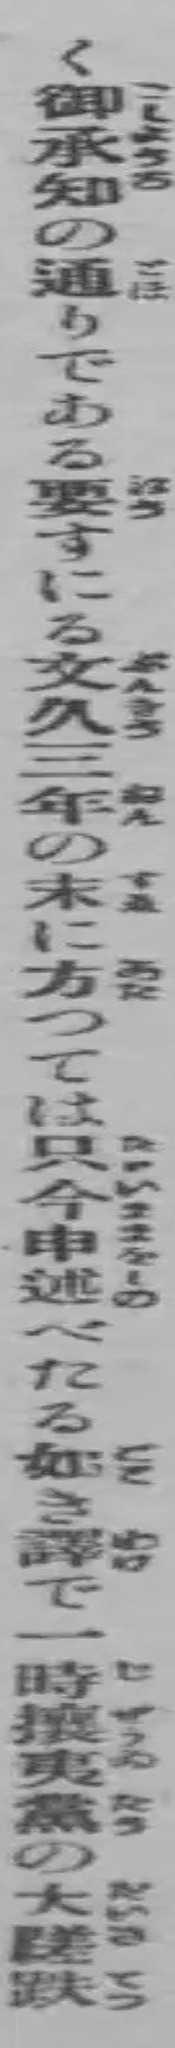く御承知の通りである要するに文久三年の末に方つては只今申述べたる如き訳で一時攘夷党の大蹉跌
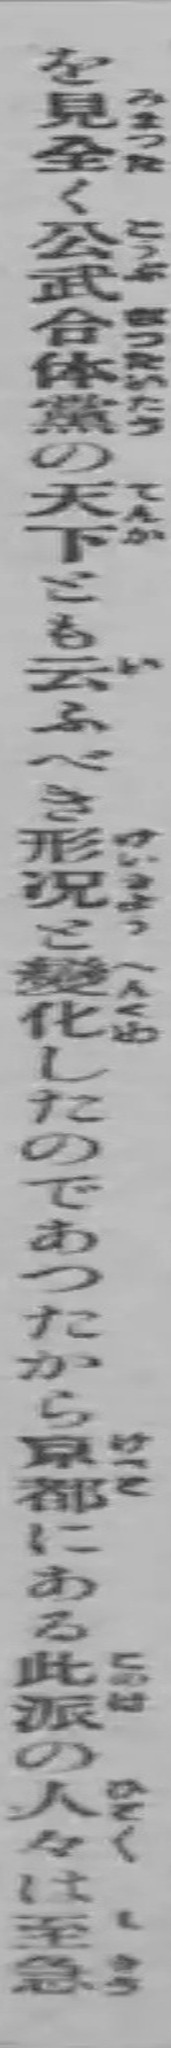を見全く公武合体党の天下とも云ふべき形況と変化したのであつたから京都にある此派の人々は至急
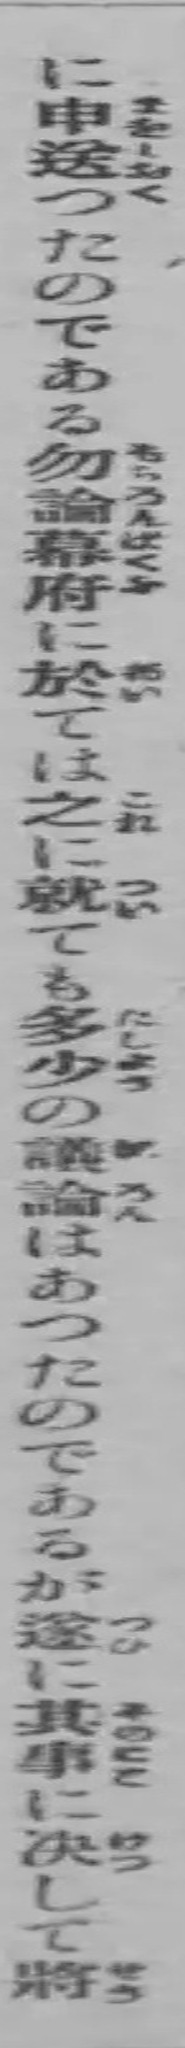に申送つたのである勿論幕府に於ては之に就ても多少の議論はあつたのであるが遂に其事に決して将
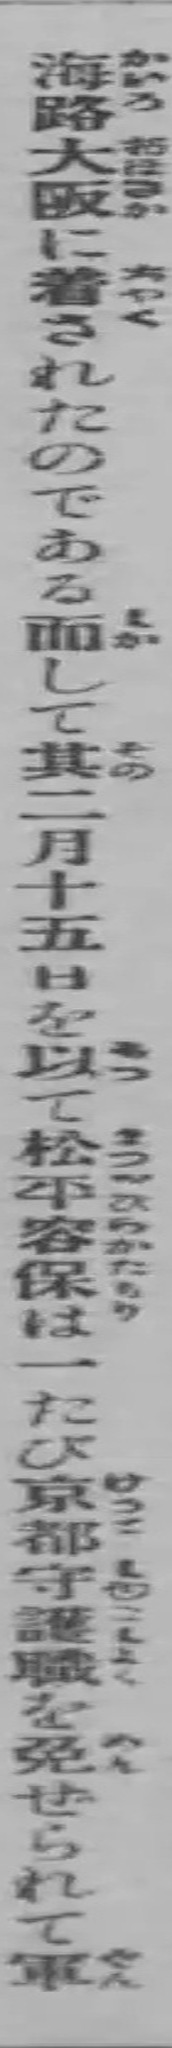海路大阪に着されたのである而して其二月十五日を以て松平容保は一たび京都守護職を免ぜられ軍
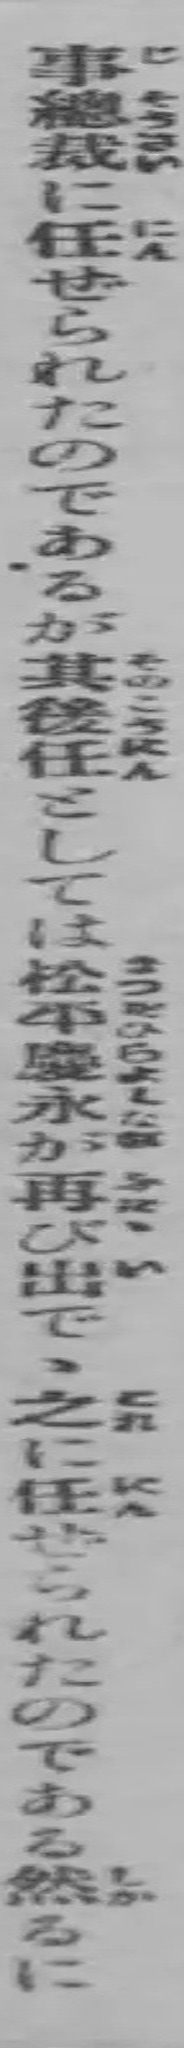事総裁に任ぜられたのであるが其後任としては松平慶永が再び出でゝ之に任ぜられたのである然るに
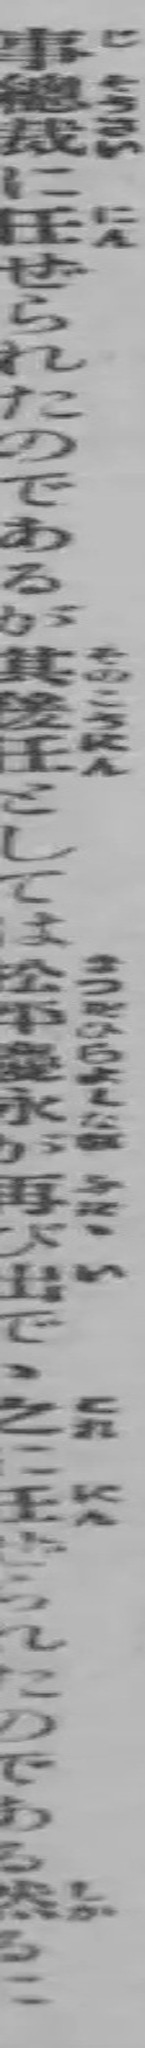事総裁に任ぜられたのであるが其後任としては松平慶永が再び出でゝ之に任ぜられたのである然るに
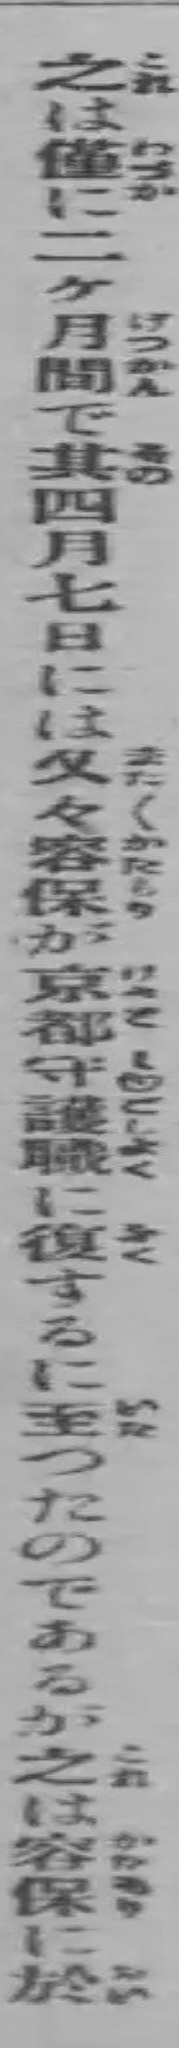之は僅に二ヶ月間で其四月七日には又々容保が京都守護職に復するに至つたのであるが之は容保に於

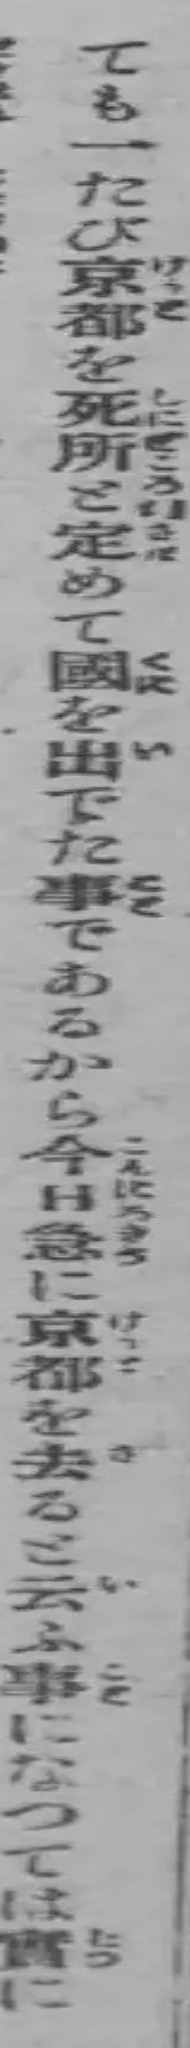ても一たび京都を死所と定めて国を出でた事であるから今日急に京都を去ると云ふ事になつては実に
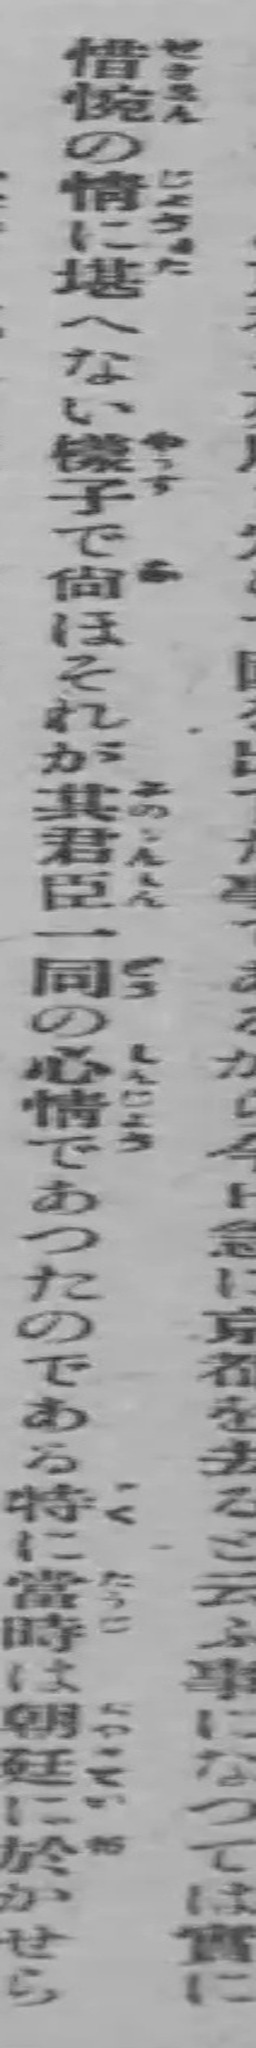惜惋の情に堪へない様子で尚ほそれが其君臣一同の心情であつたのである特に当時は朝廷に於かせら
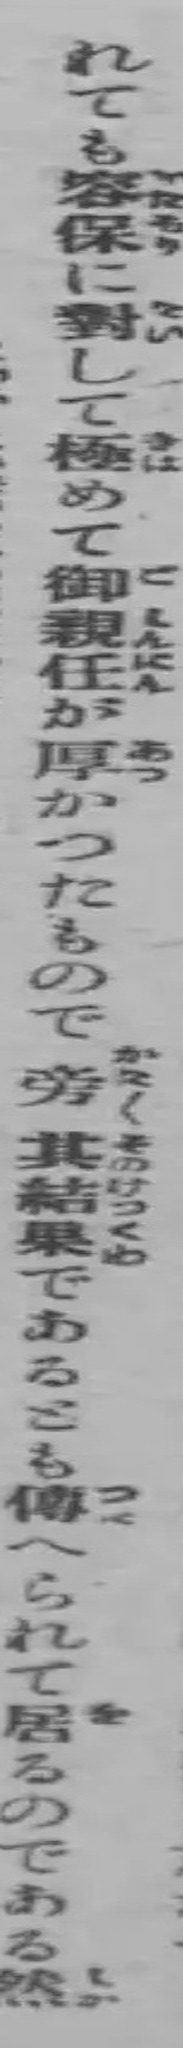れても容保に対して極めて御親任が厚かつたもので旁其結果であるとも伝へられて居るのである然
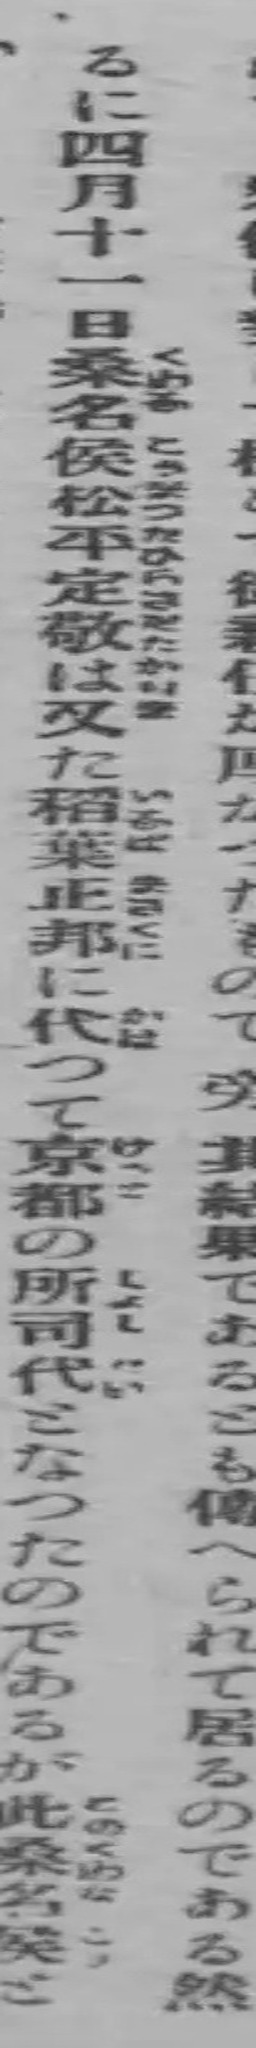るに四月十一日桑名侯松平定敬は又た稲葉正邦に代つて京都の所司代となつたのであるが此桑名侯と
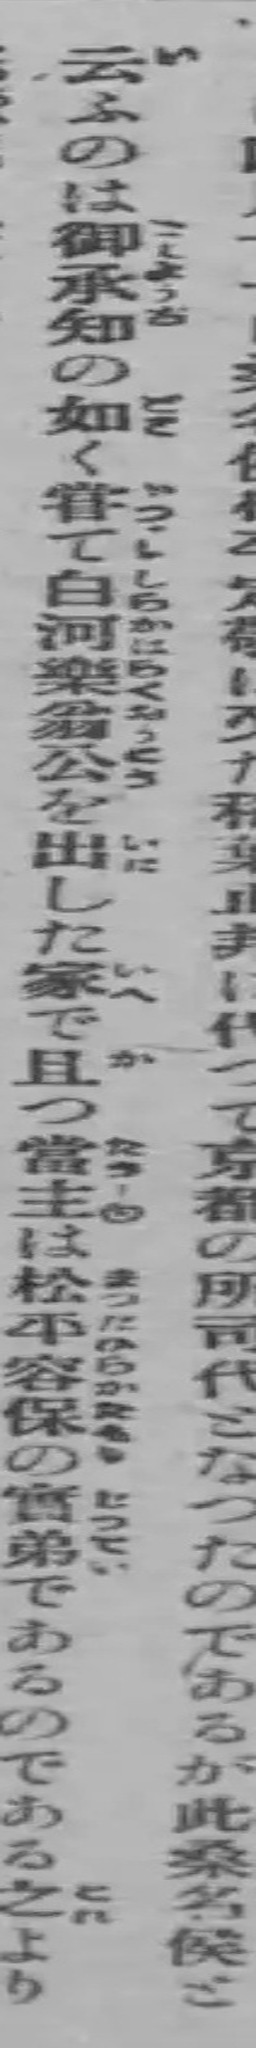云ふのは御承知の如く嘗て白河楽翁公を出した家で且つ当主は松平容保の実弟であるのである之より
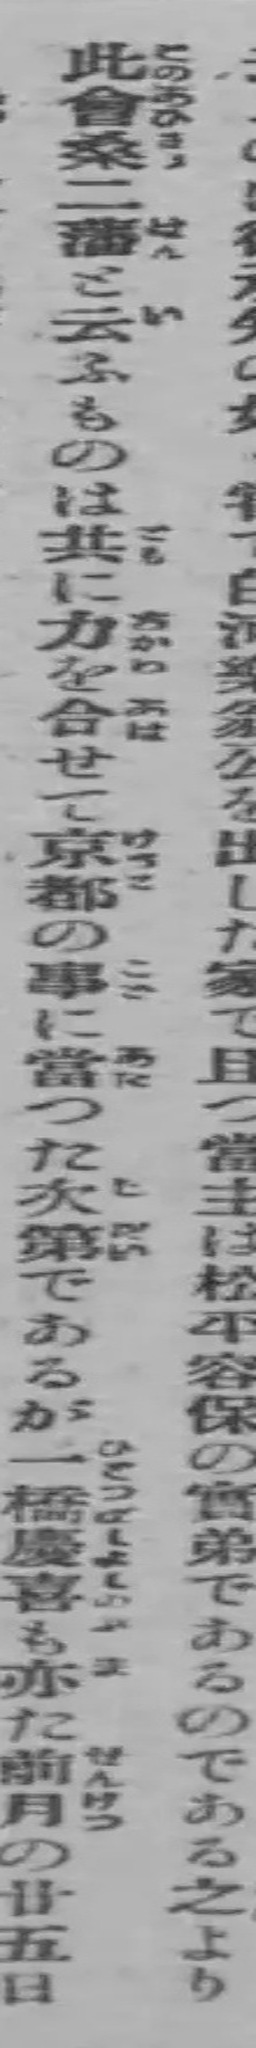此会桑二藩と云ふものは共に力を合せて京都の事に当つた次第であるが一橋慶喜も亦た前月の廿五日
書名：豊橋市史談
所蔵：国立国会図書館 National Diet Library, JAPAN
